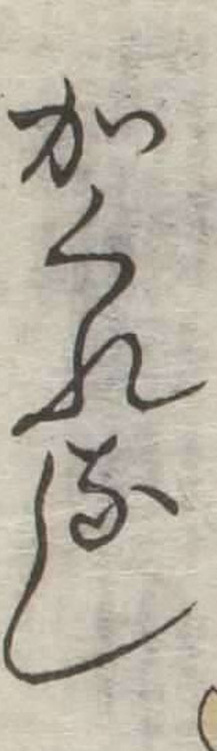かくれなし
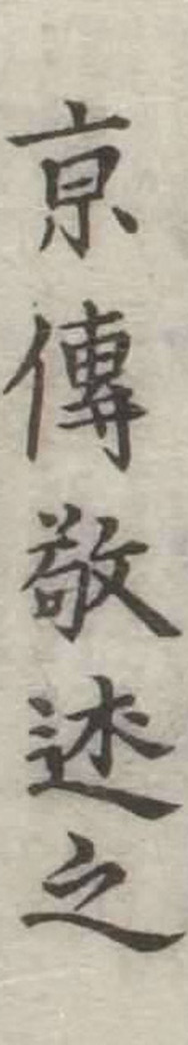京伝敬述之

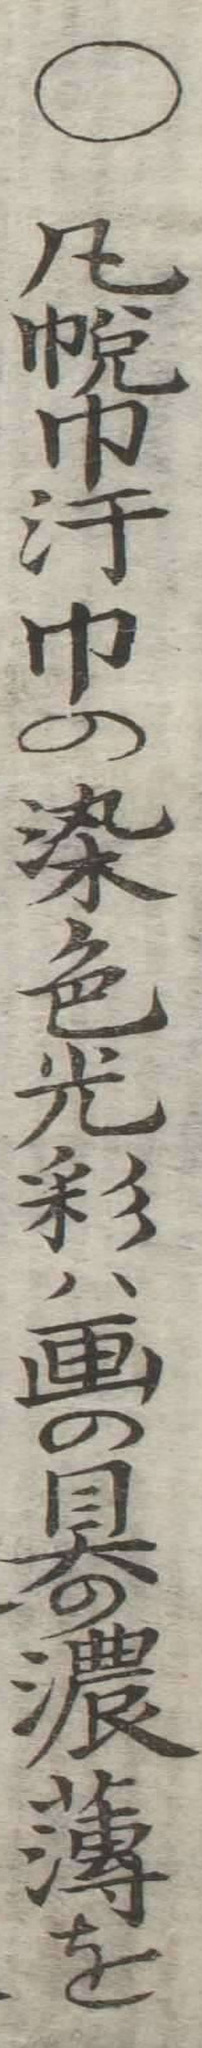○凡帨巾汗巾の染色光彩は画の具の濃薄を
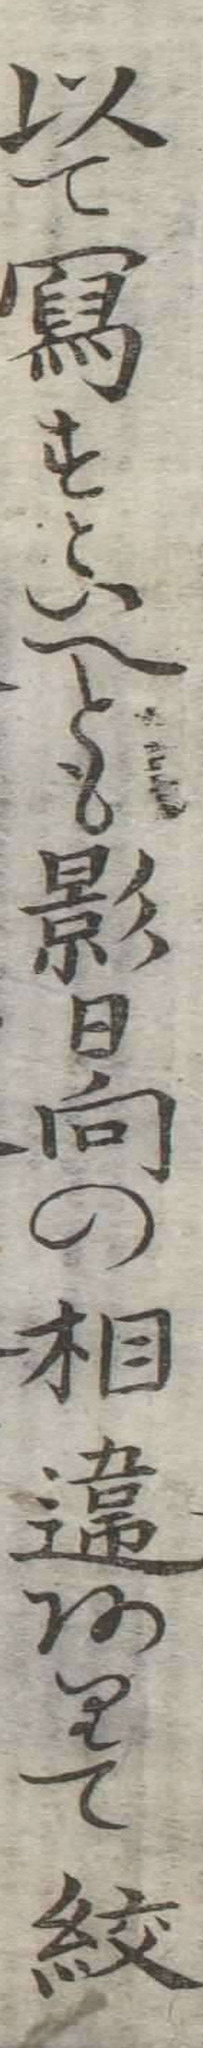以て写すといへとも影日向の相違ありて絞
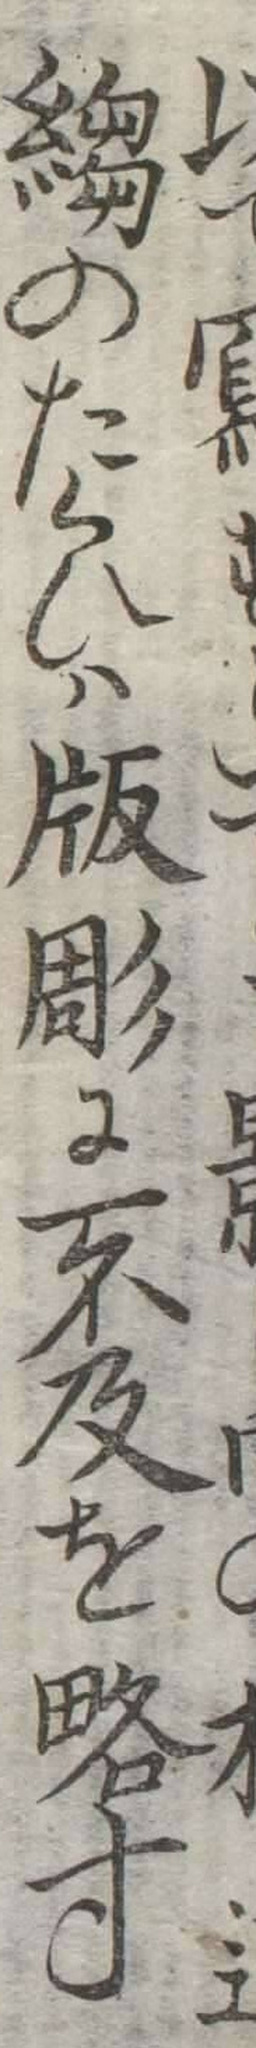縐のたくひは版彫に不及を略す
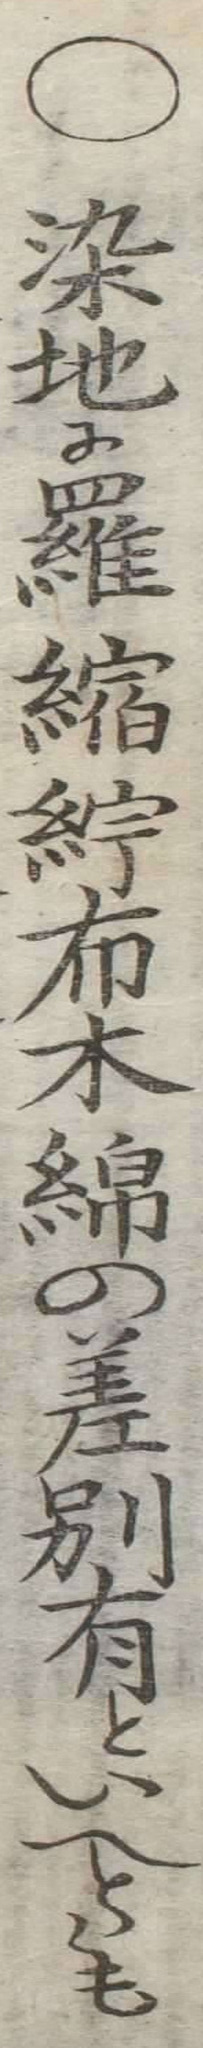○染地に羅縮紵布木綿の差別有といへとも
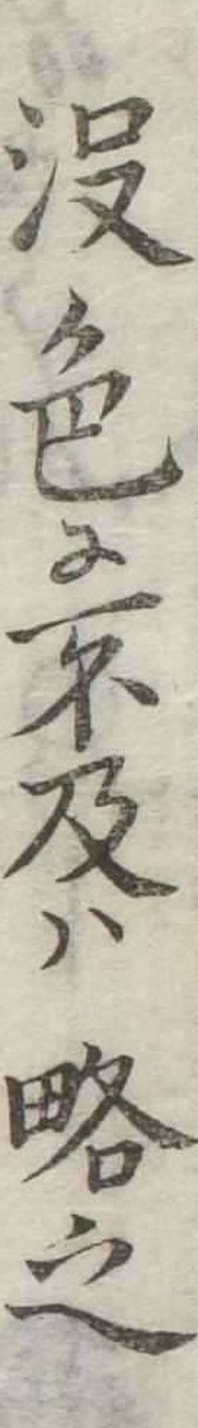没色に不及は略之
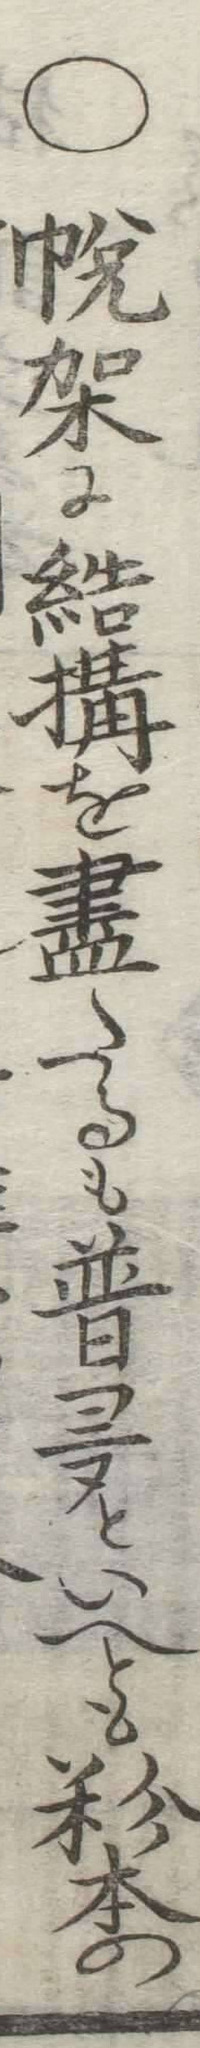○帨架に結構を尽たるも普多といへとも粉本の
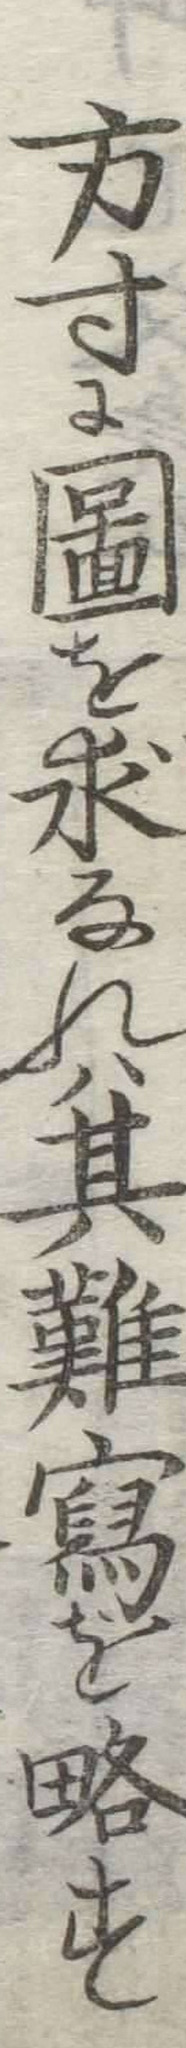方寸に図を求なれは其難写を略す
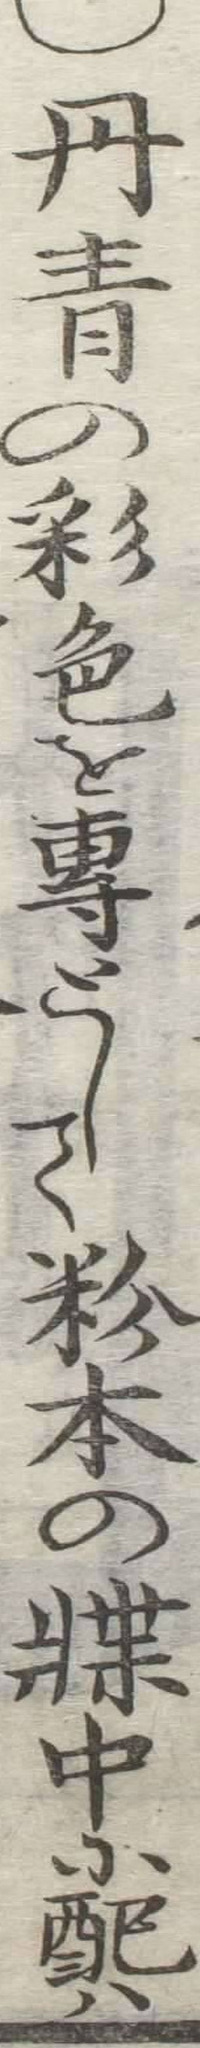○丹青の彩色を専として粉本の牒中に配は
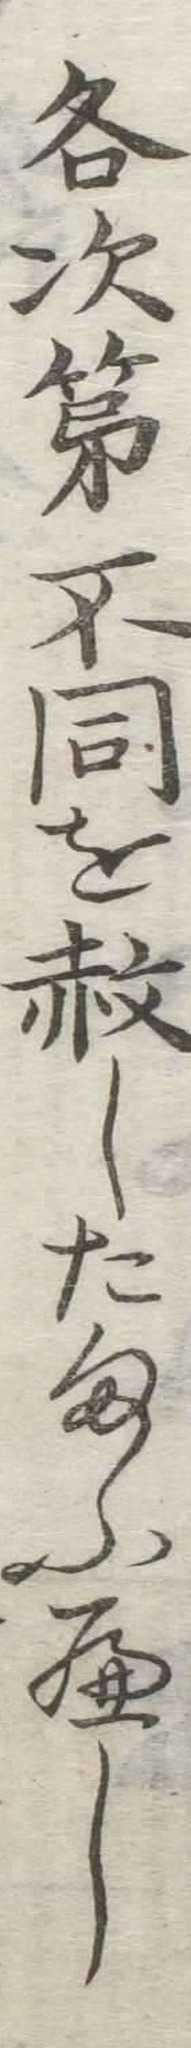各次第不同を赦したまふへし
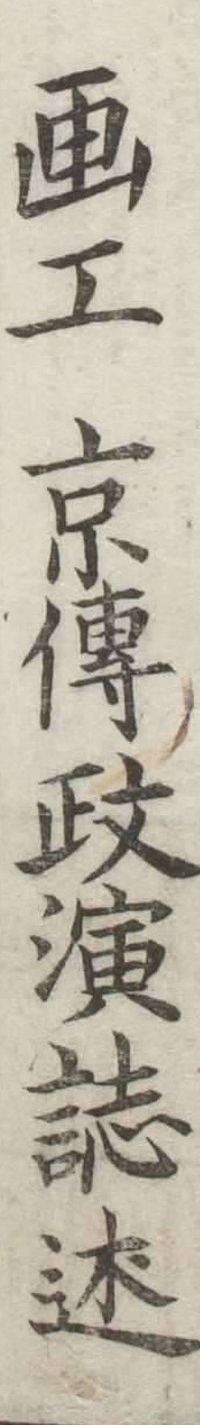画工京伝政演誌述
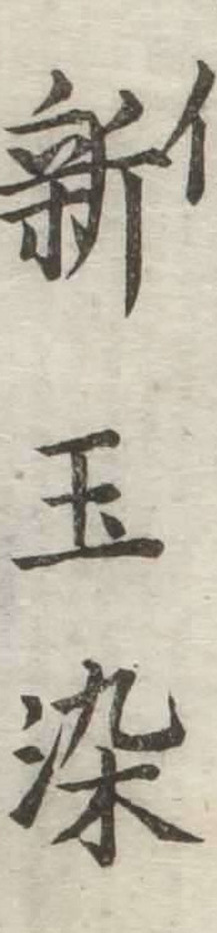新玉染
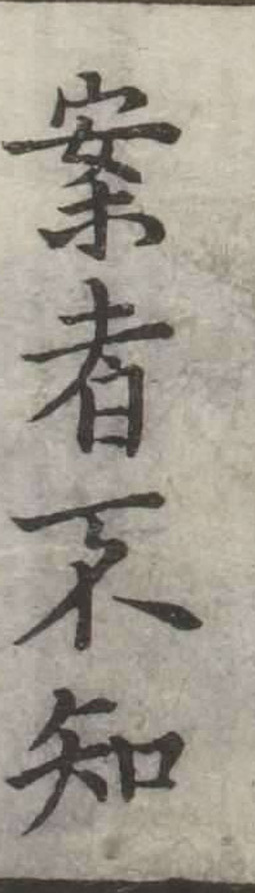案者不知

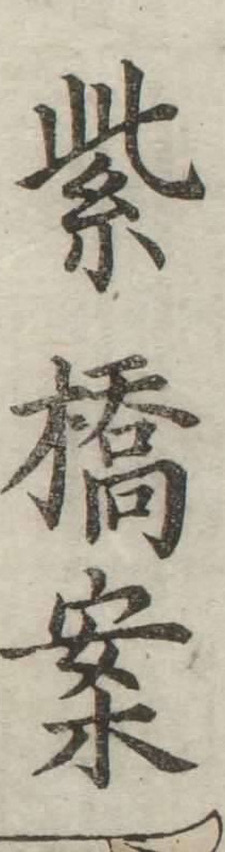紫橋案
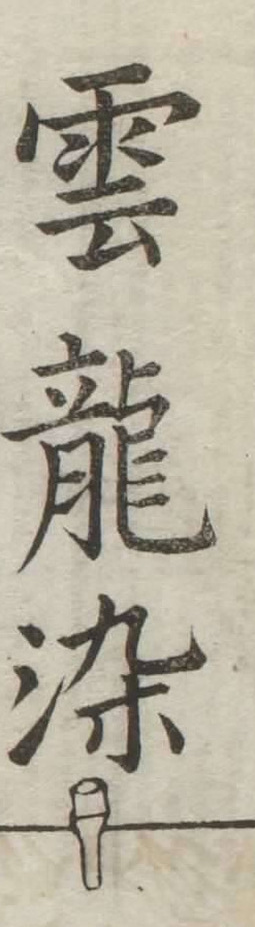雲龍染
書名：たなくひあわせ
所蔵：国文学研究資料館
